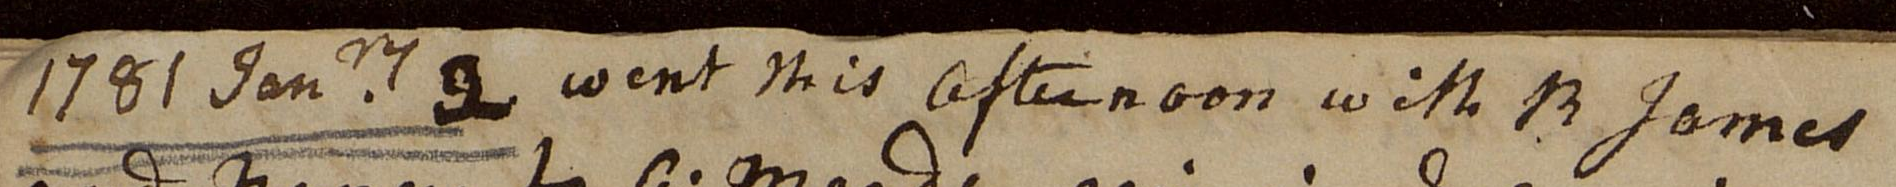1781 Jan^ry. 2 went this afternoon with R James
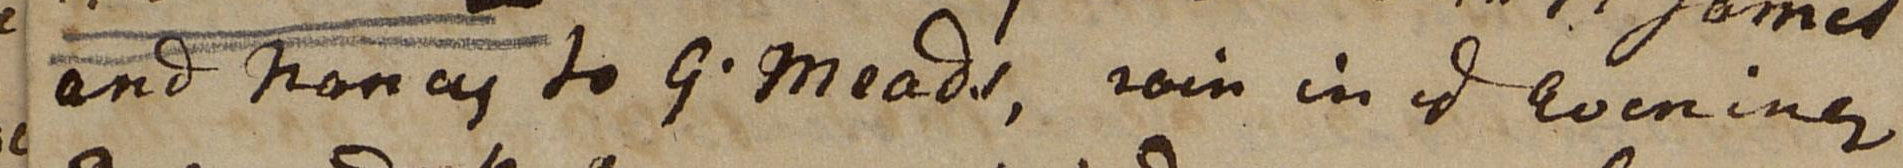and Nancy to G. Meads, rain in y^e Evening
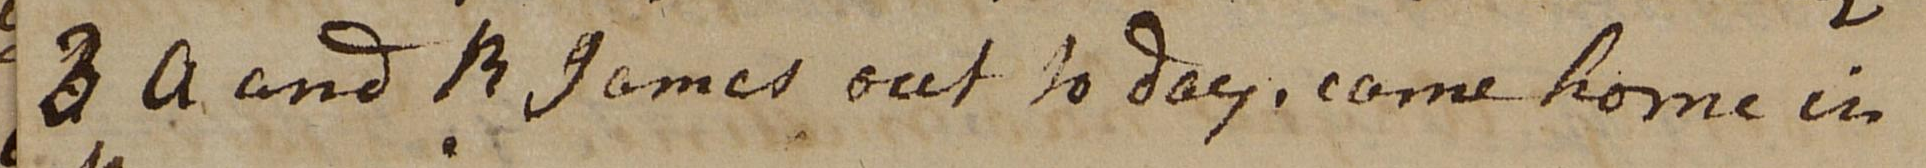3 A and R James out to day, came home in
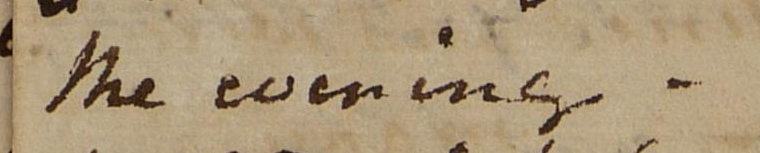the evening-
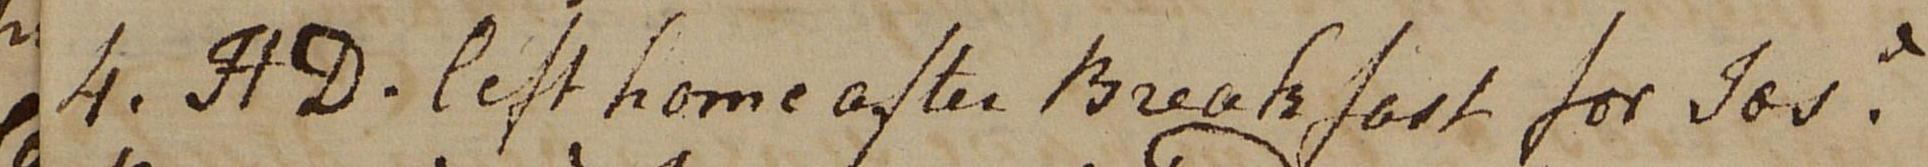4. HD. left home after Breakfast for Jos.^a
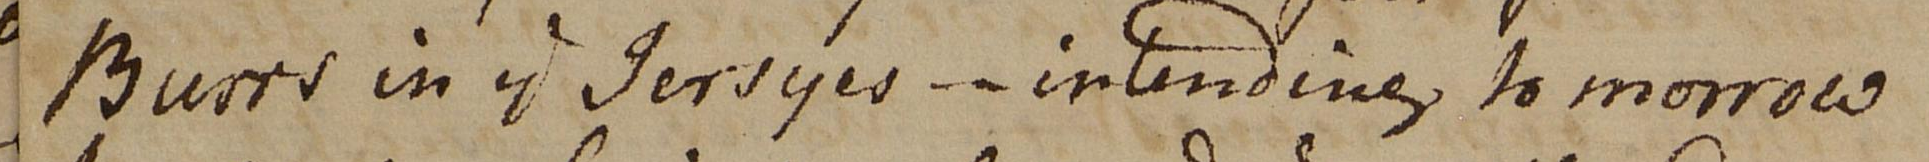Burrs in y^e Jersyes-- intending to morrow
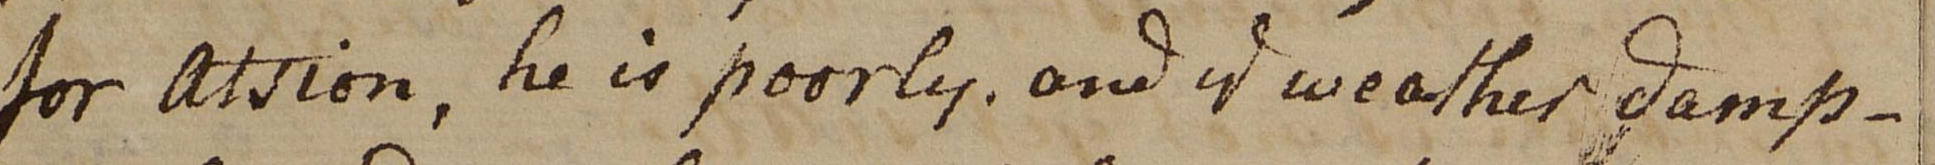for Atsion, he is poorly, and y^e weather damp-
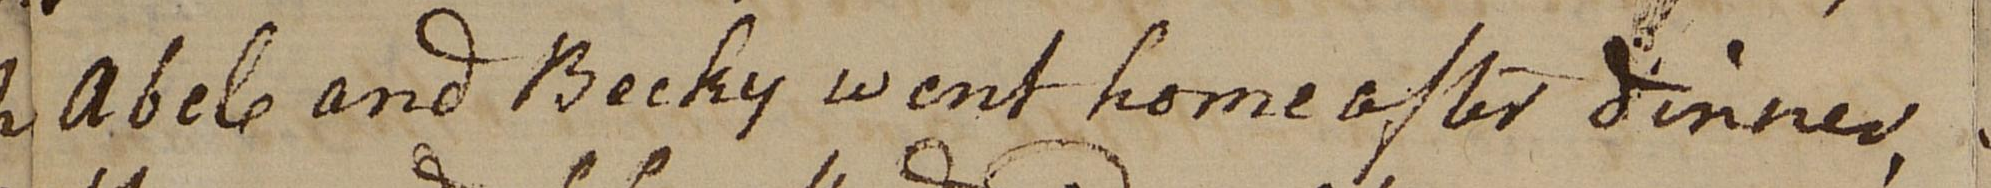Abel and Becky went home after dinner,
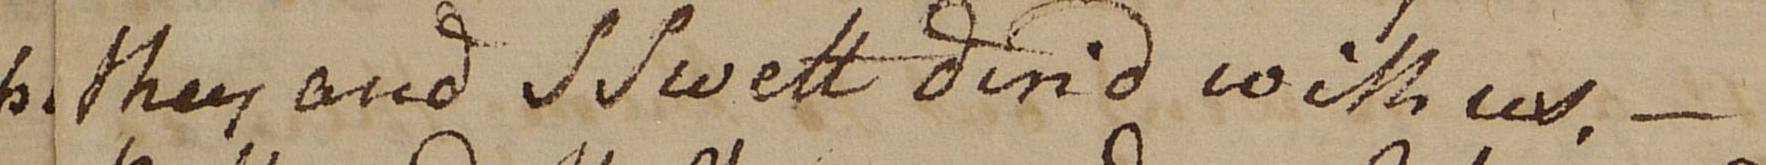they and S Swett din'd with us,-
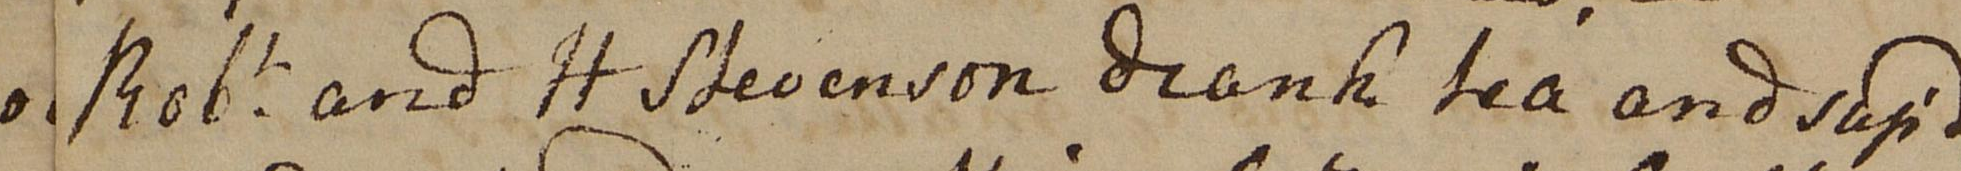Rob^t. and H Stevenson drank tea and sup'd.
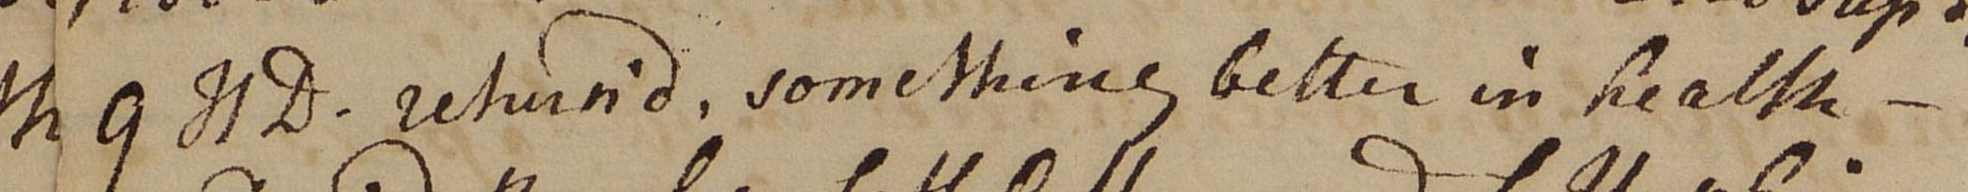9 HD- return'd, something, better in health-
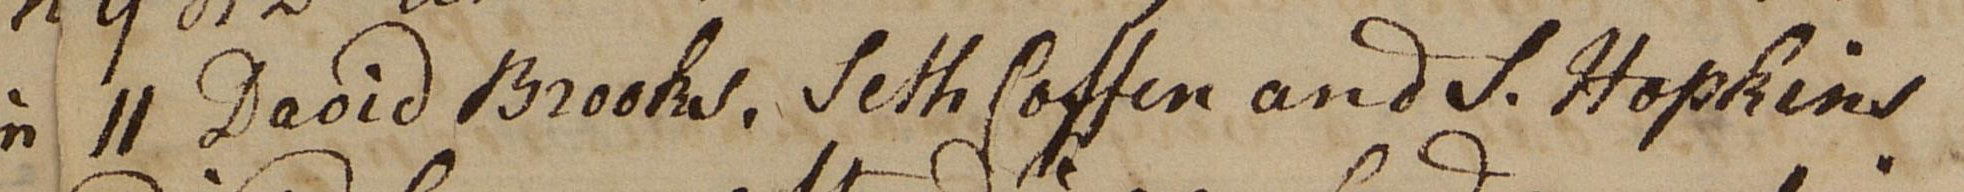11 David Brooks, Seth Coffen and S. Hopkins
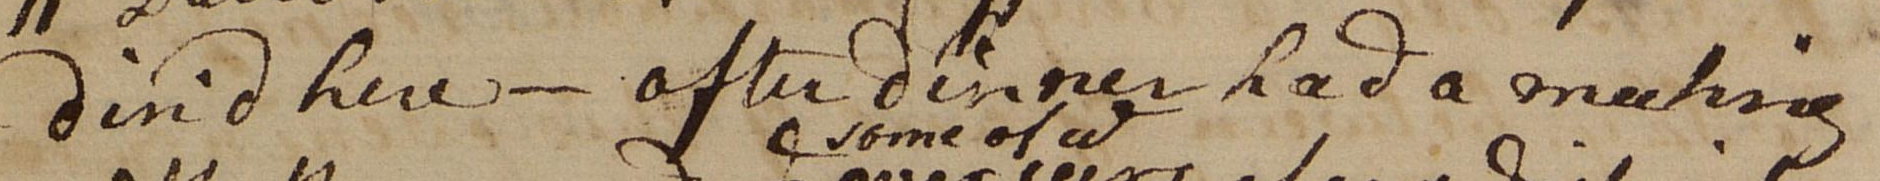din'd here- after dinner had a meeting
